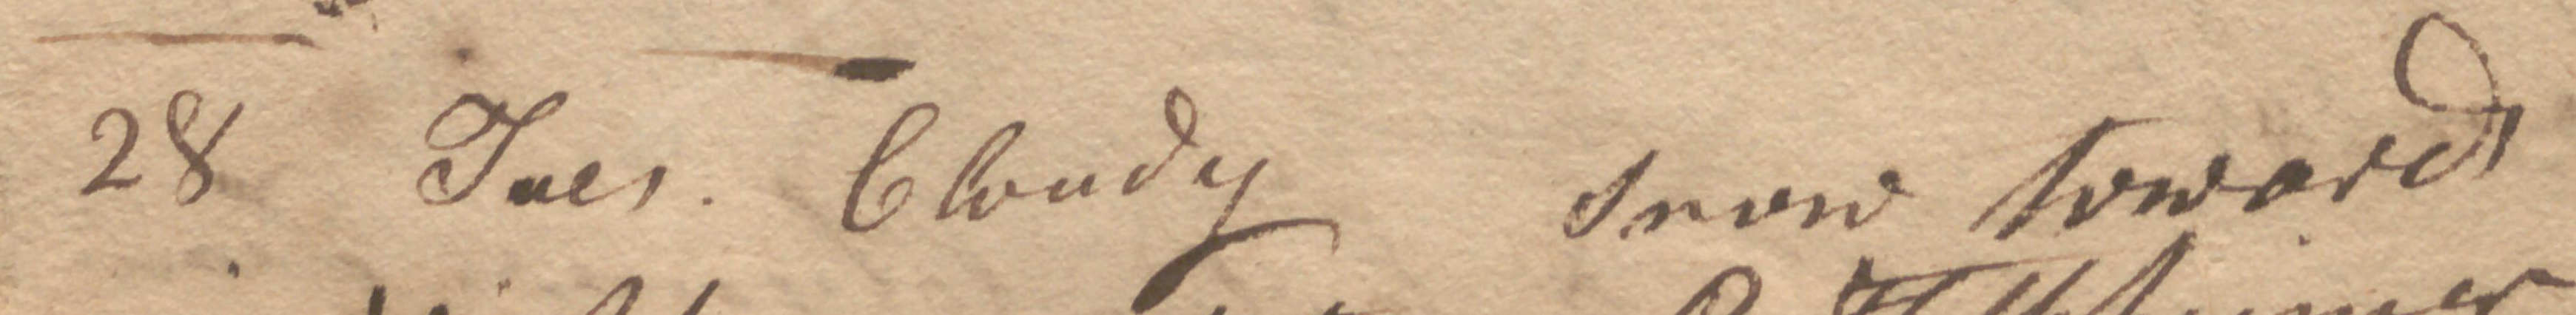28 Tues. Cloudy snow towards
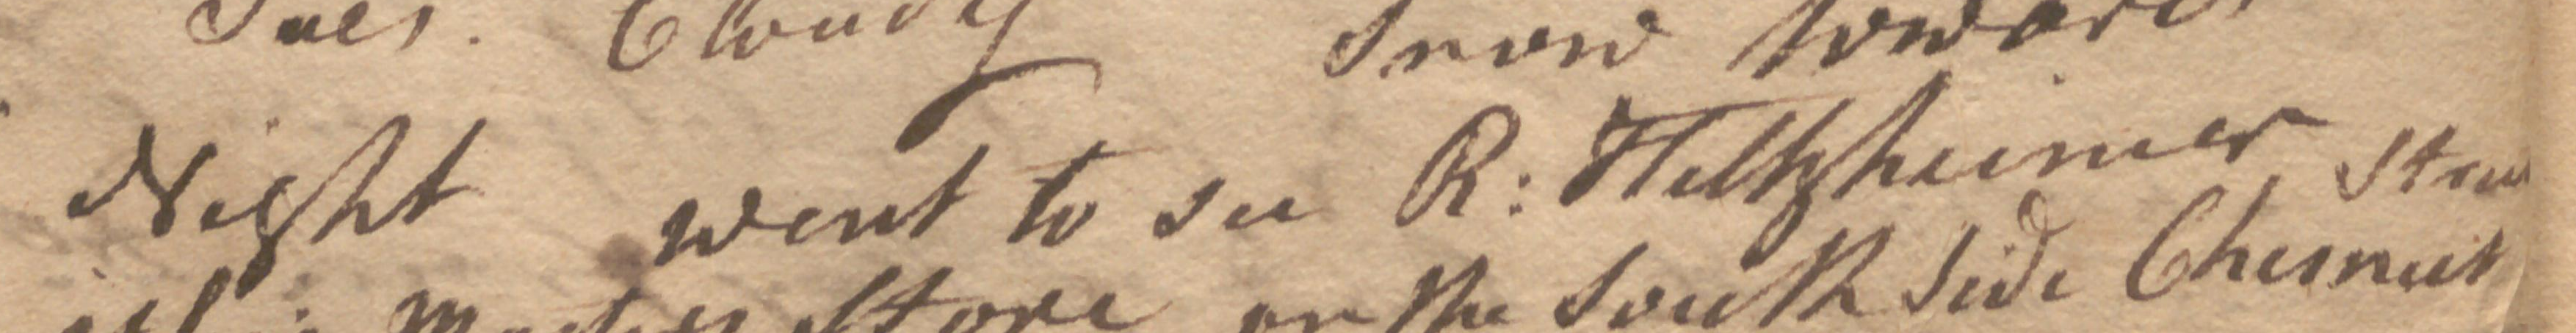Night went to see R.: Hiltzheimer, Stru
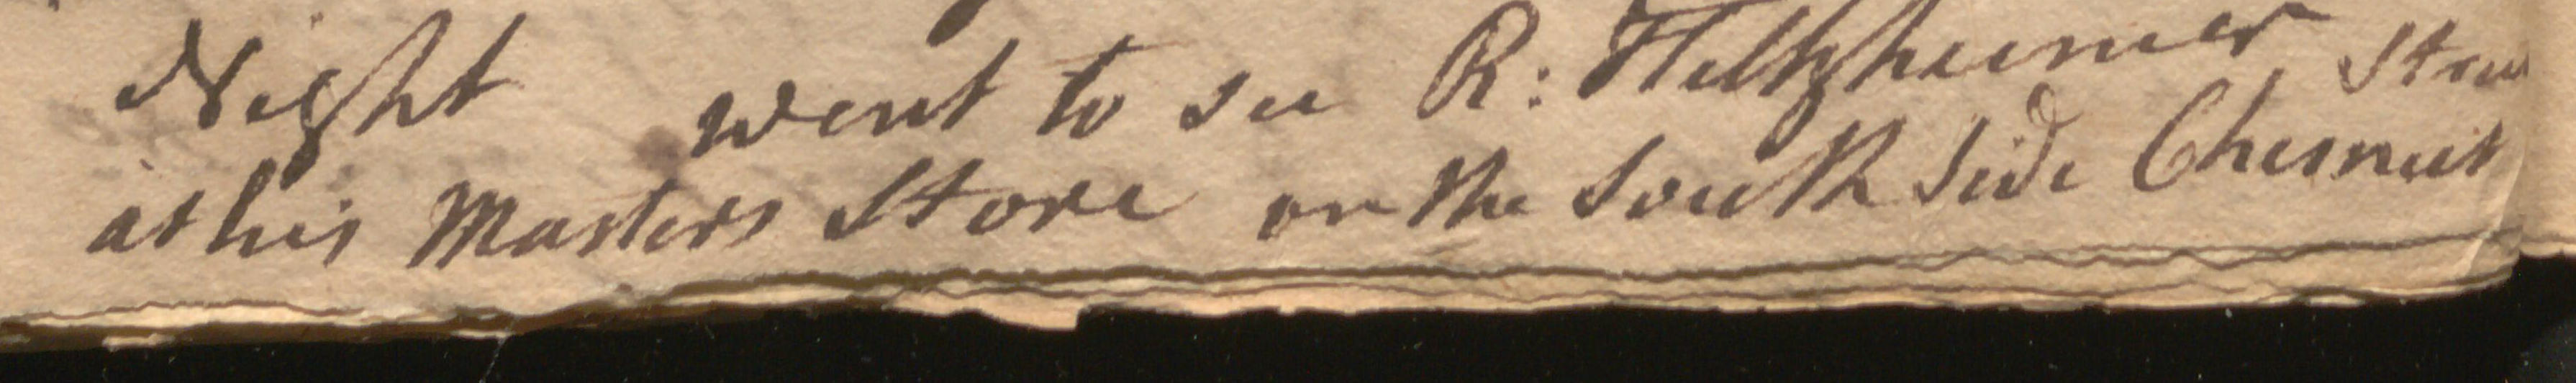at his Masters Store on the South side Chesnut
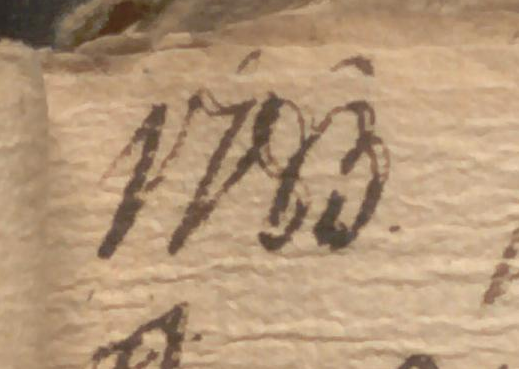1783
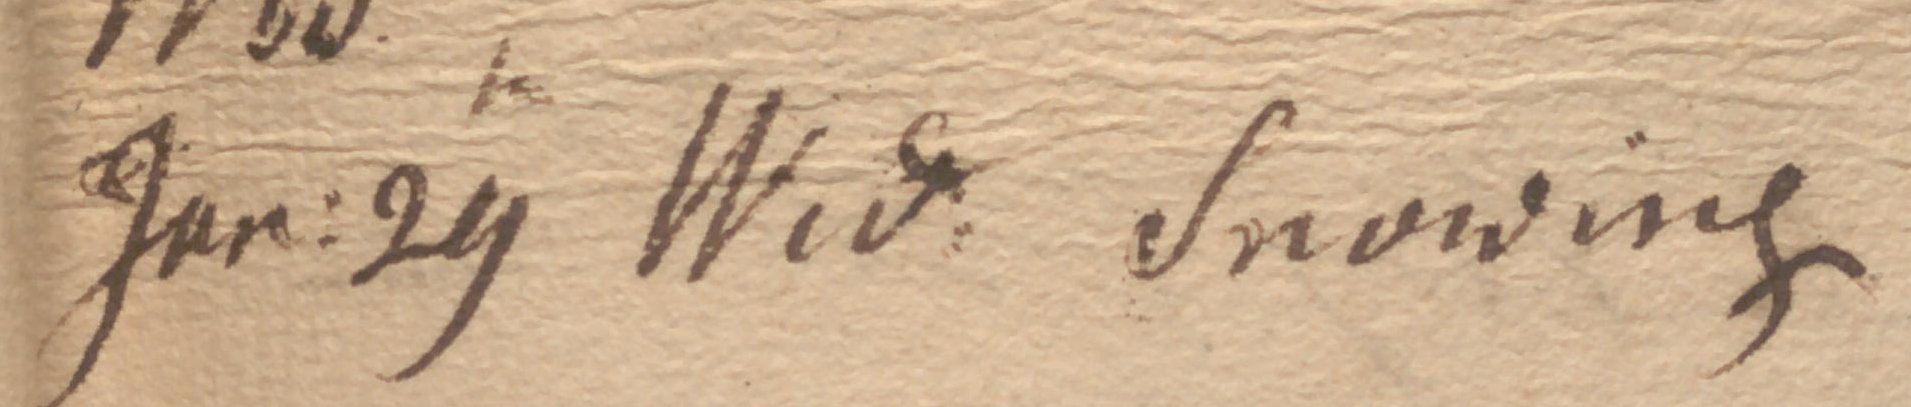Jan: 29^th Wed. Snowing
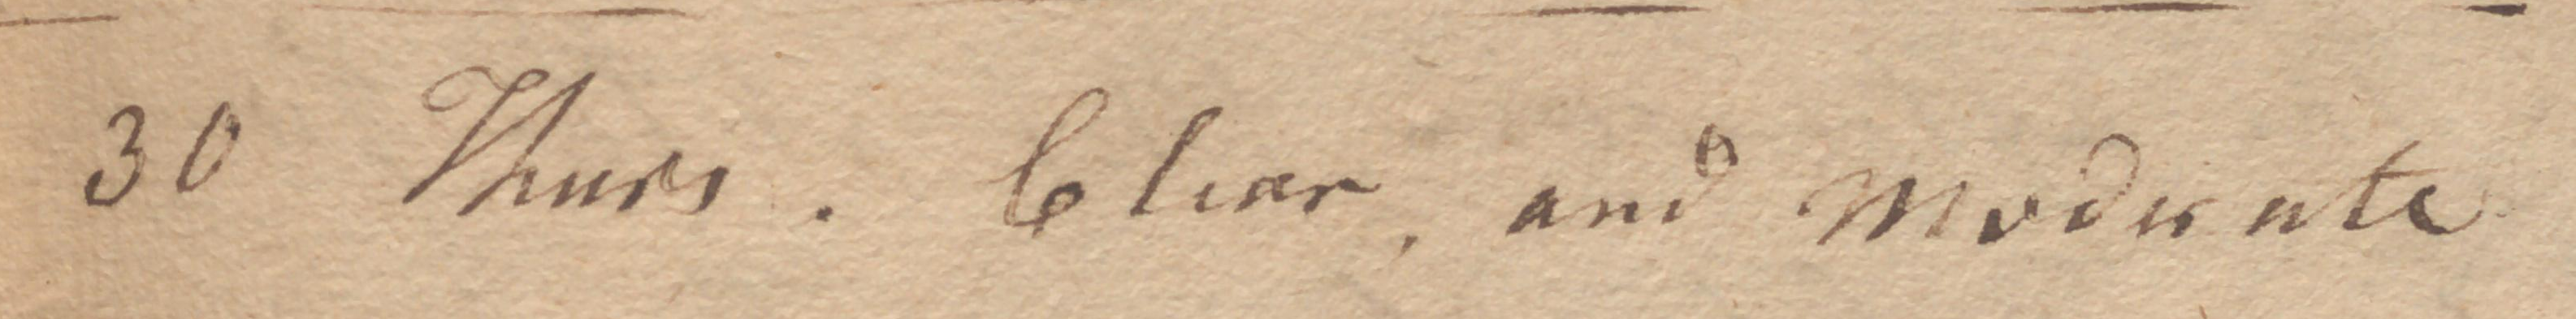30 Thurs. Clear, and moderate
